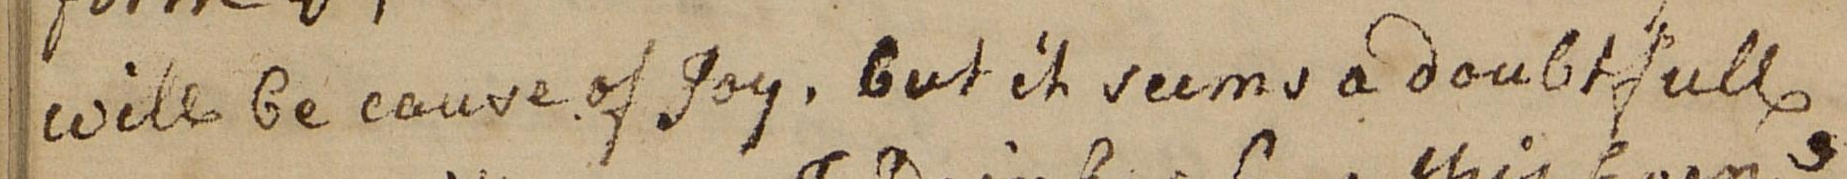will be cause of Joy, but it seems a doubt full
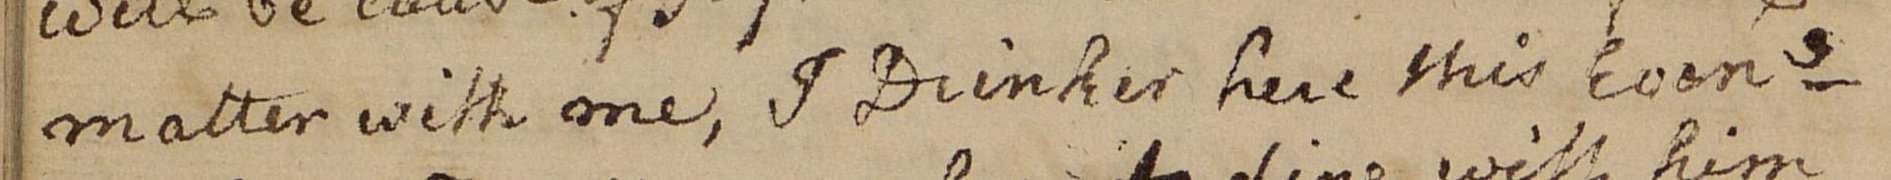matter with me, I Drinker here this Even^g-
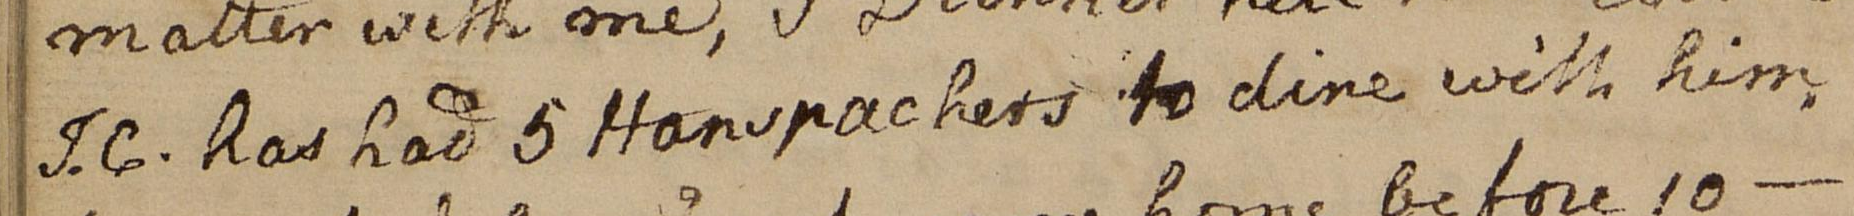I.C. has had 5 Hanspachers to dine with him,
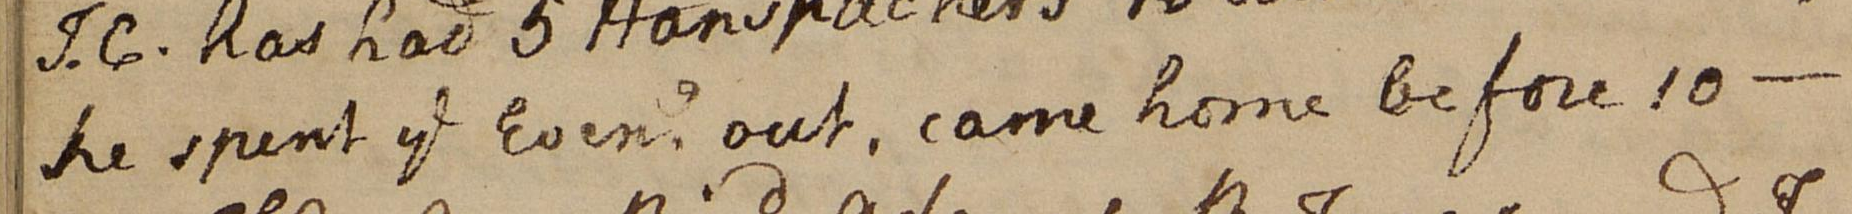he spent y^e Even^g. out, came home before 10-
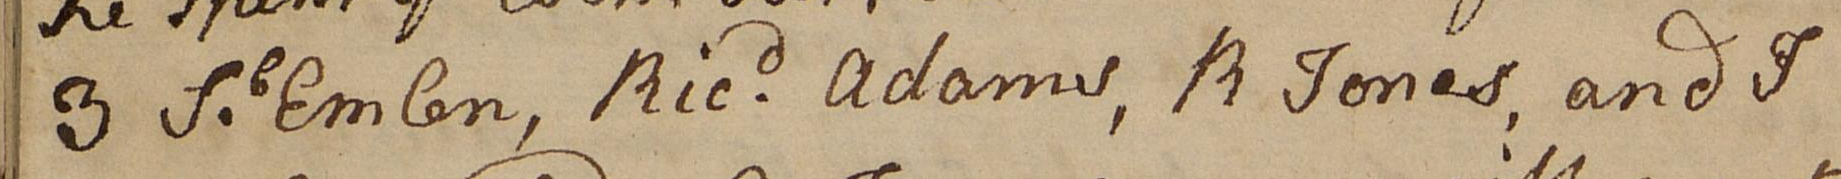3 S^l. Emlen, Ric^d. Adams, R Jones, and I
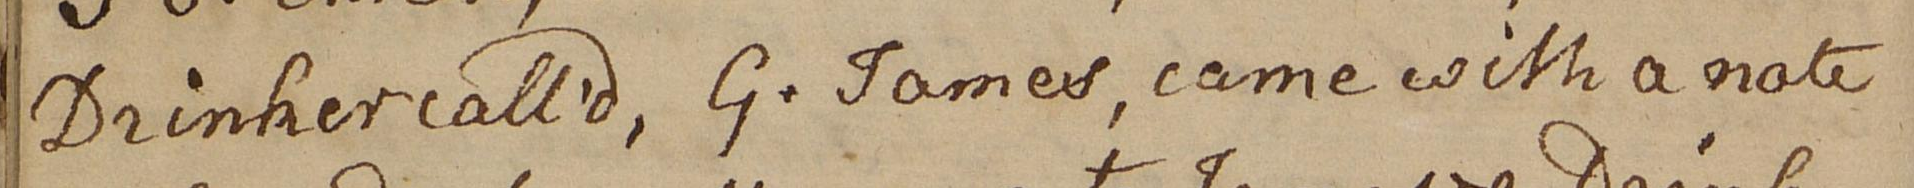Drinker call'd, G. James, came with a note
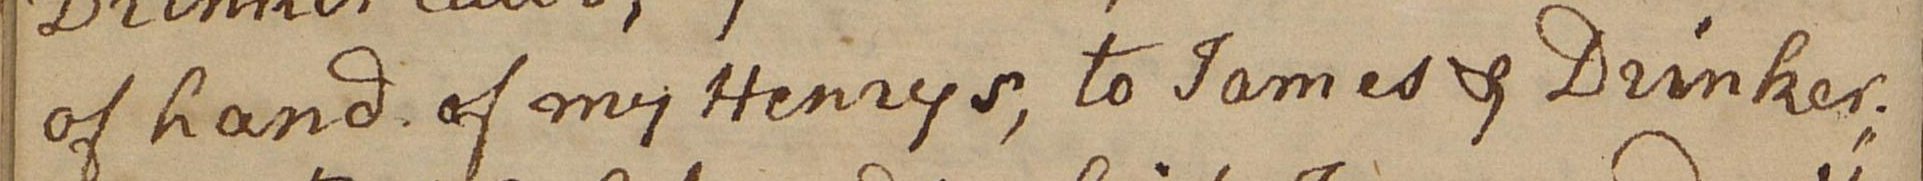of hand of my Henrys, to James & Drinker.
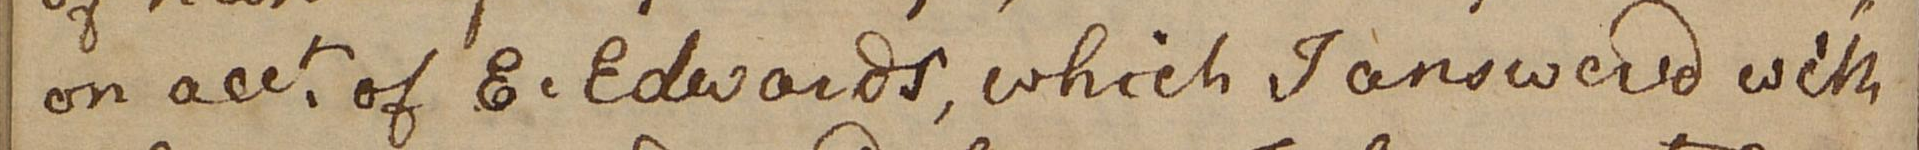on acc^t. of E. Edwards, which I answered with
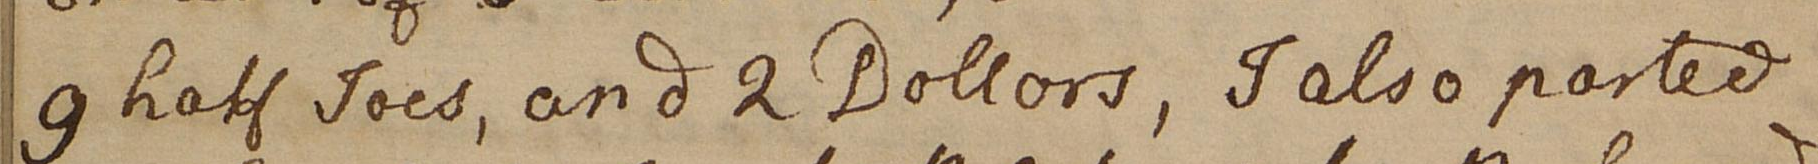9 half Joes, and 2 Dollors, I also parted
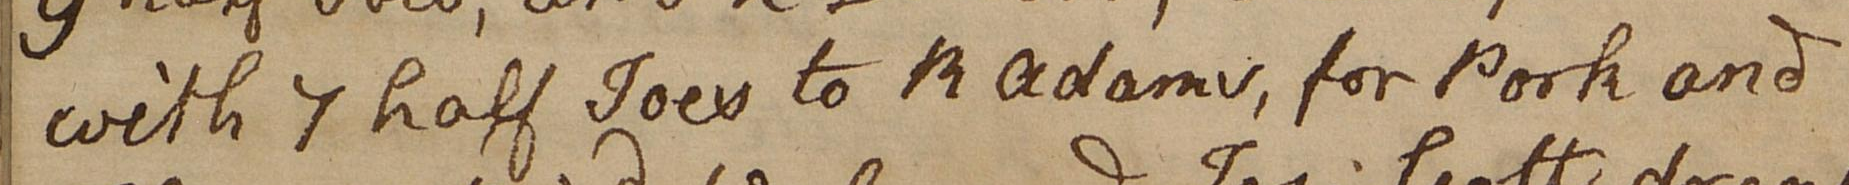with 7 half Joes to R Adams, for Pork and
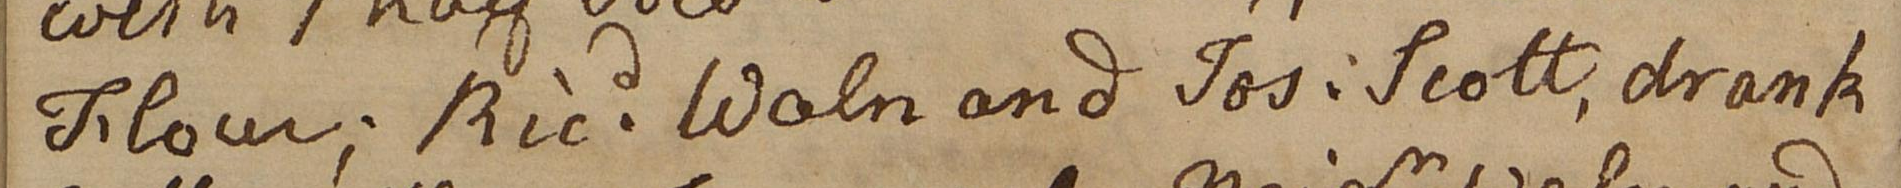Flour; Ric^d. Waln and Jos: Scott, drank
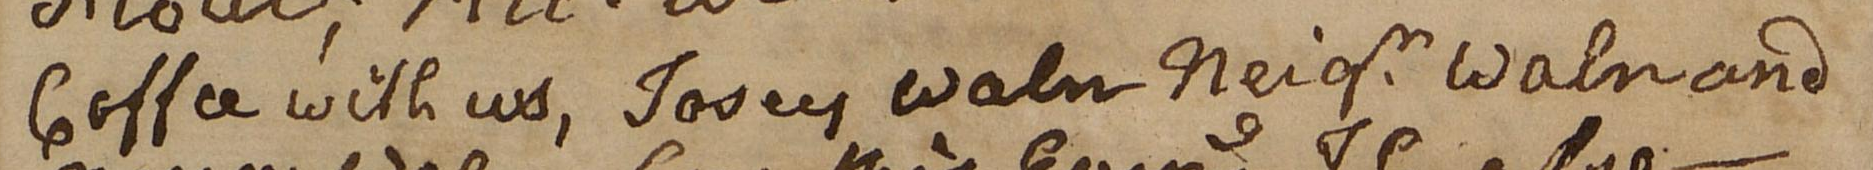Coffee with us, Josey Waln Neig^r. Waln and
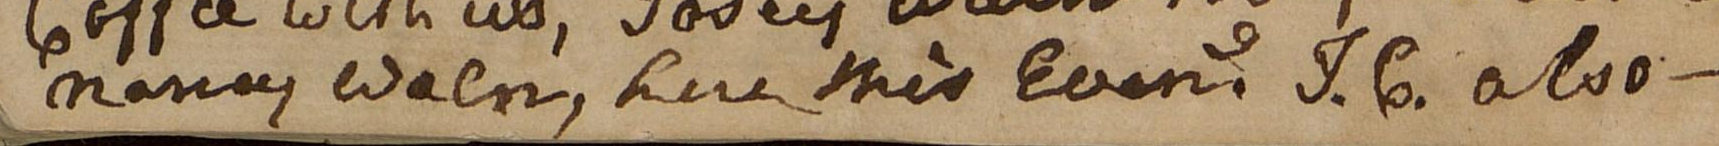Nancy Waln, here this Even^g. I. C. also-
